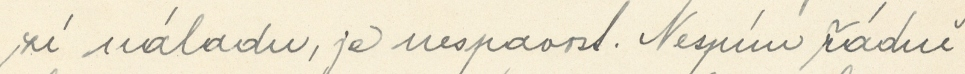zí náladu, je nespavost. Nespím řádně
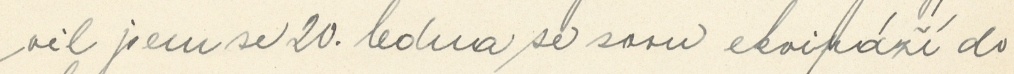vil jsem se 20. ledna se svou ekvipáží do
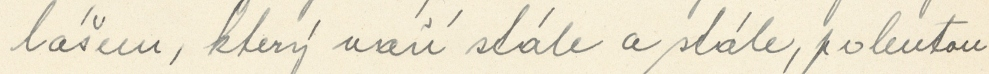lášem, který vaří stále a stále, polentou
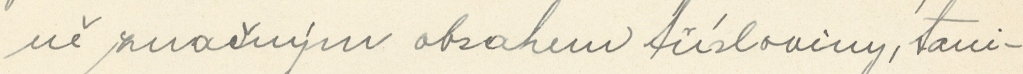ně značným obsahem třísloviny, tani-
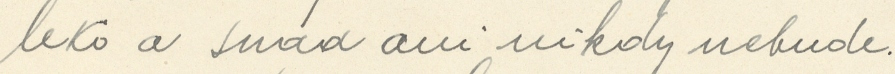leko a snad ani nikdy nebude.
